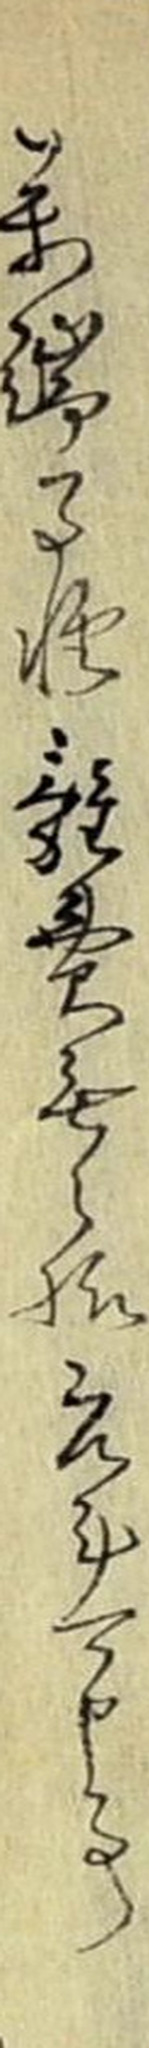万端事軽雑費無之様取計可申事
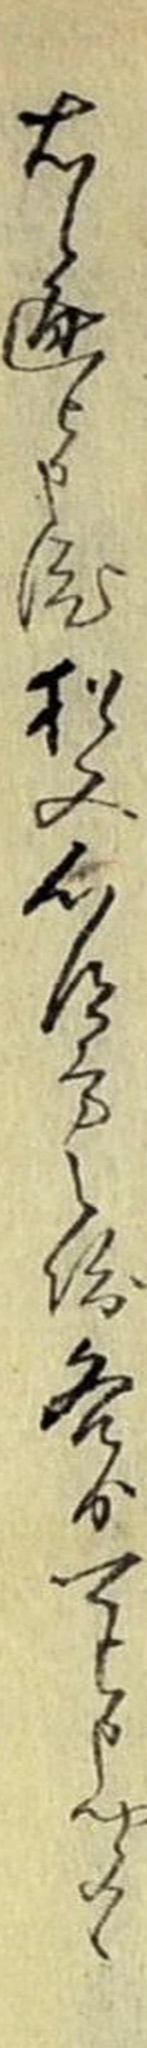右之通被申渡猶又心得方之儀各ゟ可被申聞候
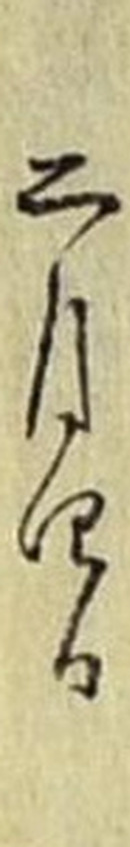二月四日
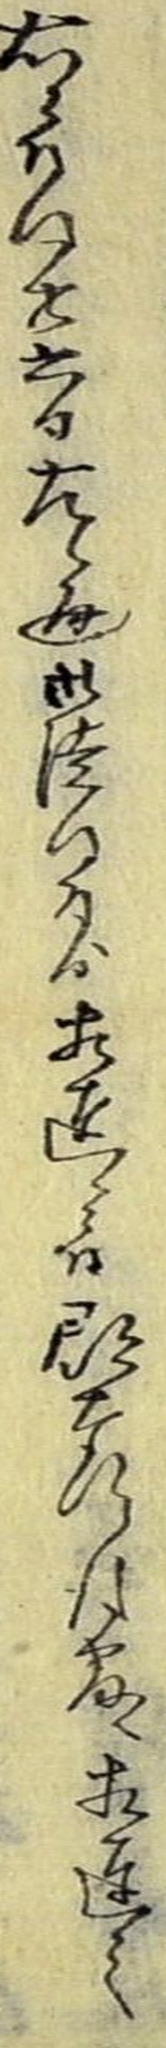右ニ付同廿六日左之通御徒目付ゟ相達候ニ付郡奉行月番へ相達之

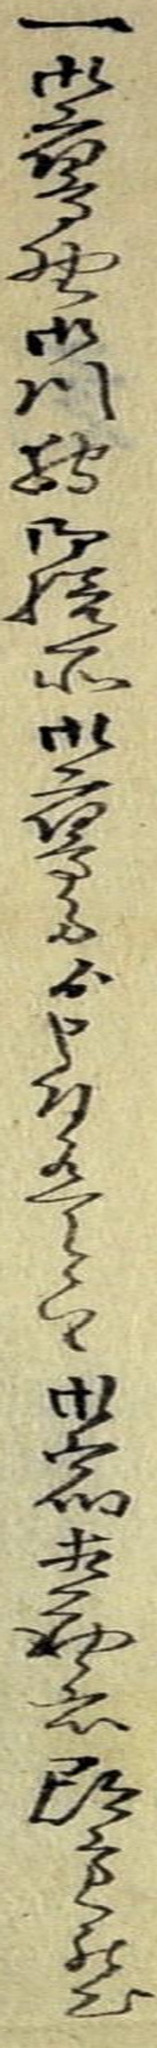一御鷹野御川狩御膳所御鷹方ゟ申付有之候ハヽ御宿相勤候者郡方へ罷出
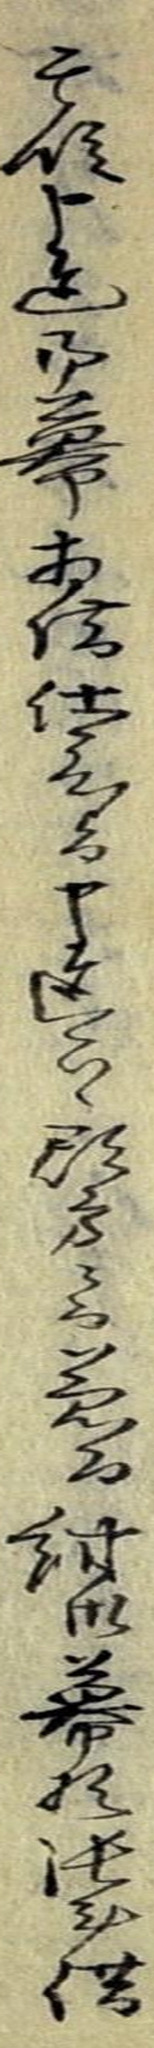其段申達御幕拝借仕度旨申達候ハヽ郡方ニ而兼而紺御幕拾帳計借
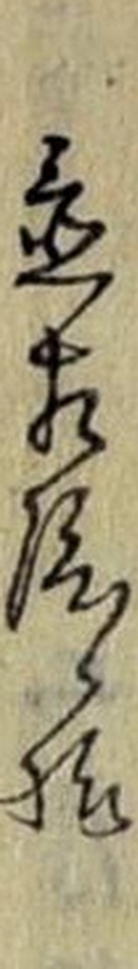置相渡候様
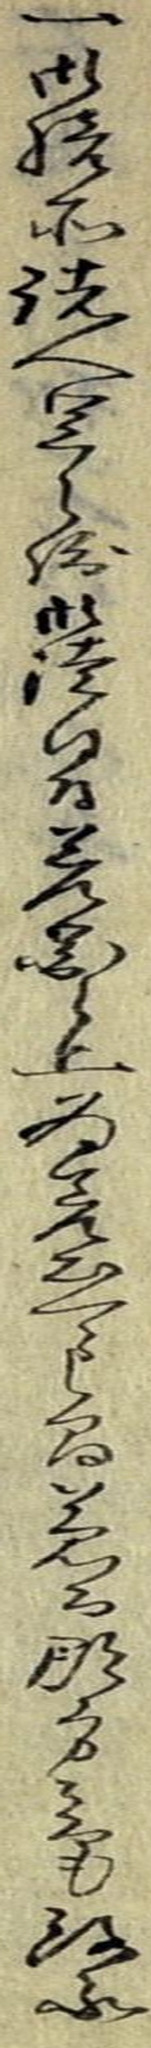一御膳所諸人足之儀御徒目付差図之上為差出可申候間兼而郡方ニ而も致承
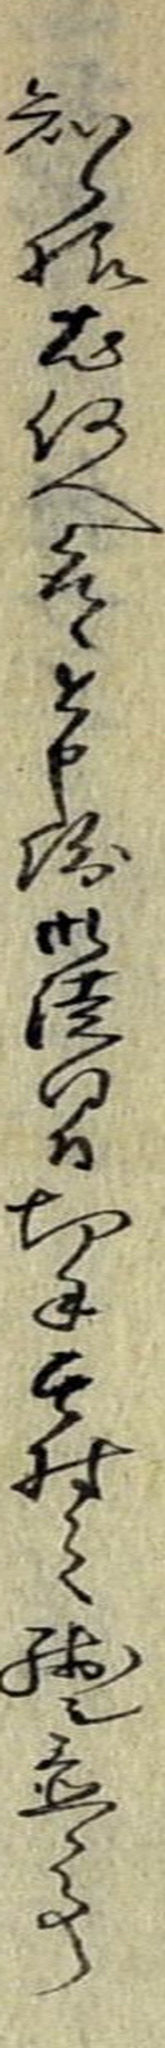知候様尤何人取候と申儀御徒目付切手其村々へ残シ置候事
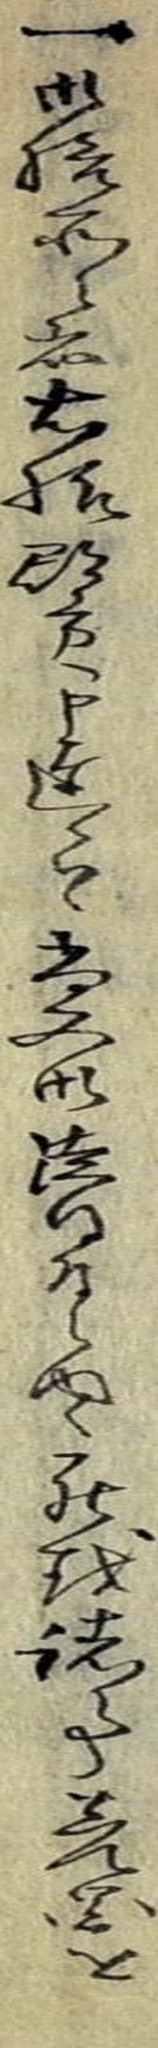一御膳所之者右様郡方へ申達候ハヽ尚又御徒目付之内へ罷越諸事差図を
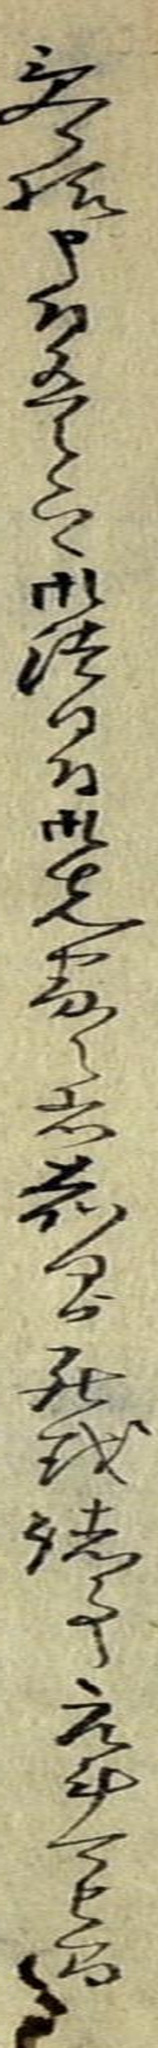受候様申付有之候ハヽ御徒目付御先番之者前日ゟ罷越諸事取計可申候間
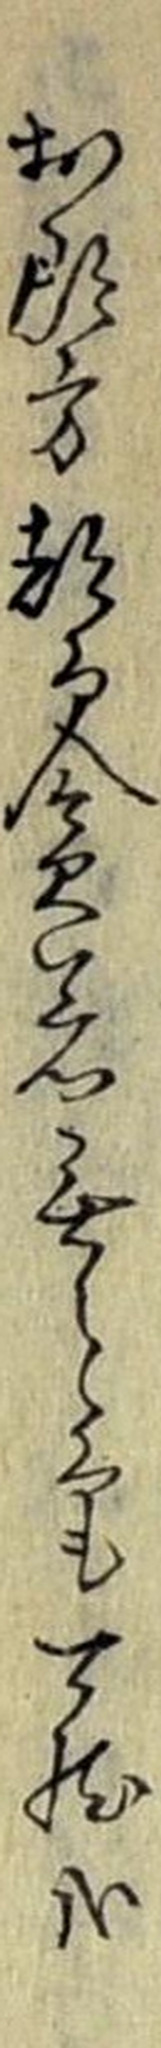於郡方都而貧着無之候而も可然哉
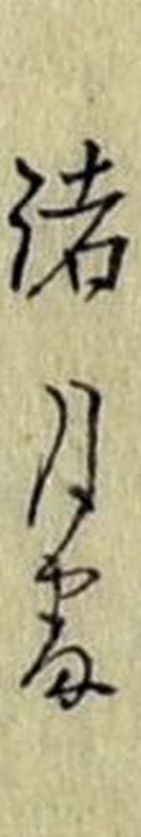諸月番
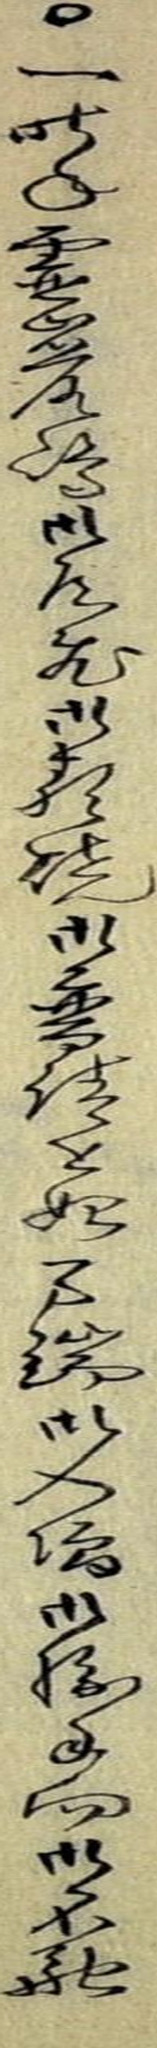〇一昨年霊巌島御屋敷御類焼御普請を始万端御入増御勝手向御不融
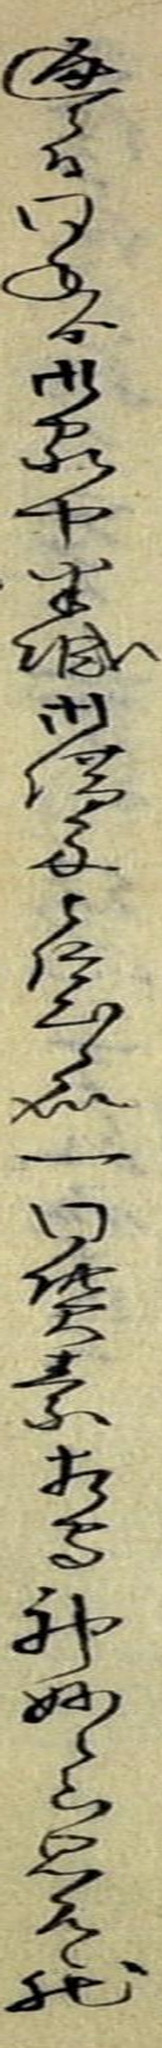通ニ付同年ゟ御家中半減御借米被仰出候処一同質素相守神妙之至思召候然
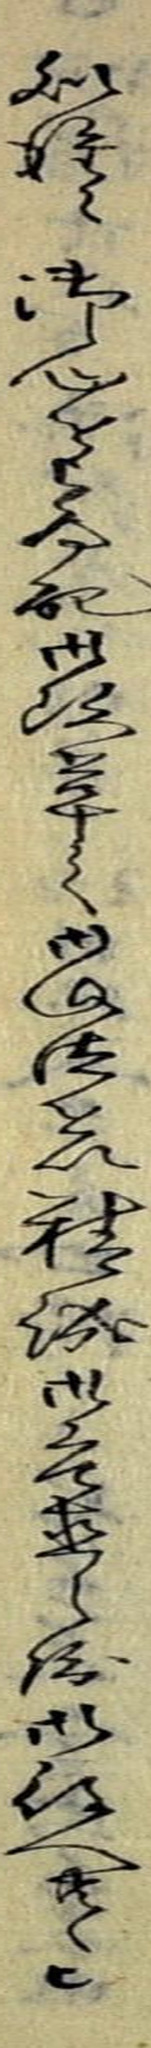処種々御心を被為配御改革之御趣法を以精誠御取直之儀御役人共へ被
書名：命令之部 五
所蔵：福井県文書館 Fukui Prefectural Archives
